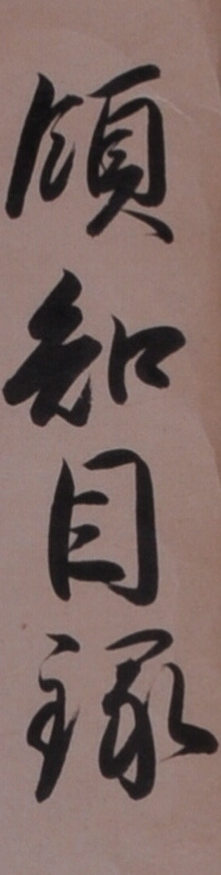領知目録

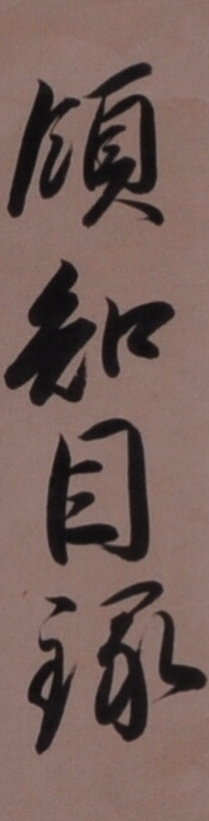領知目録
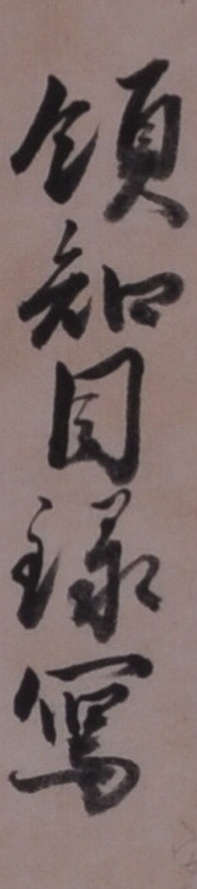領知目録写
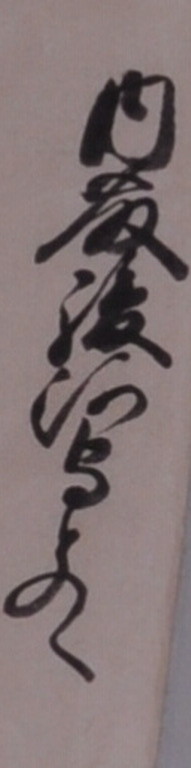内藤駿河守とのへ

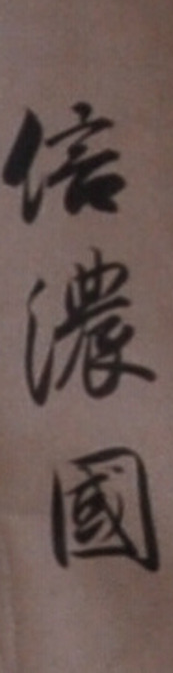信濃国
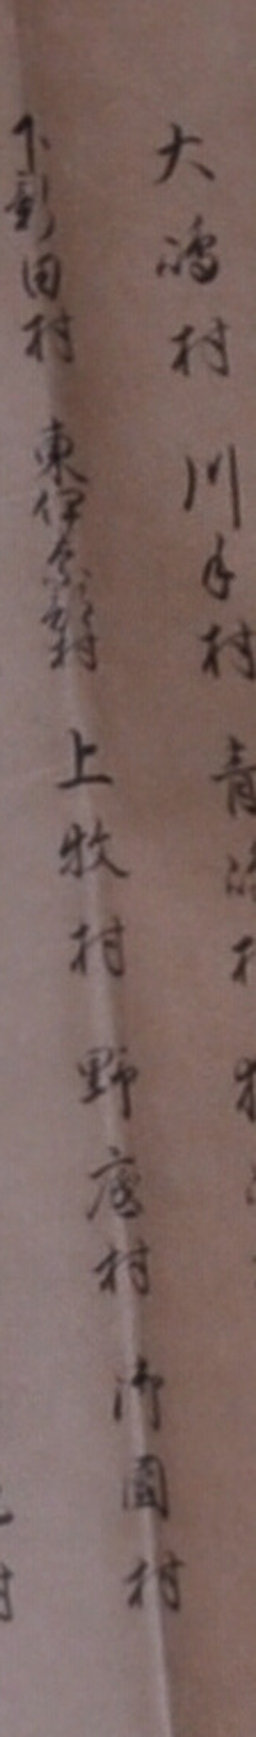下新田村東伊奈部村上牧村野底村御園村
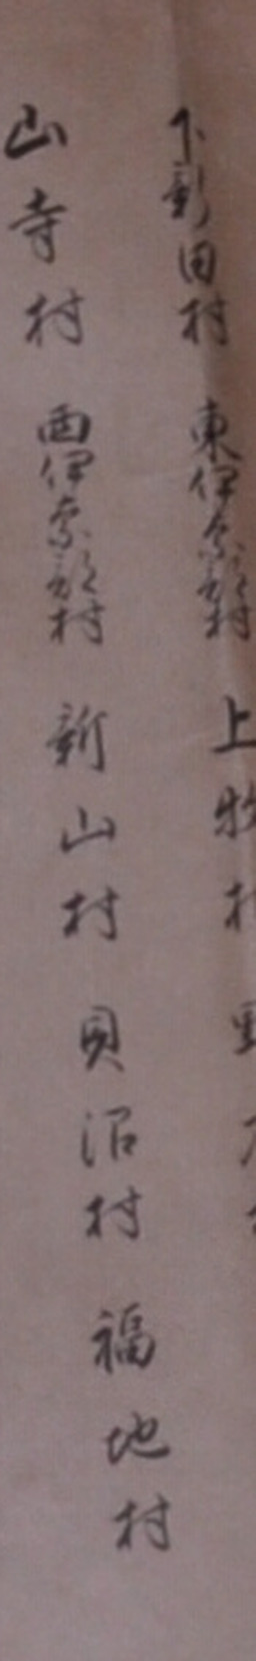山寺村西伊奈部村新山村貝沼村福地村
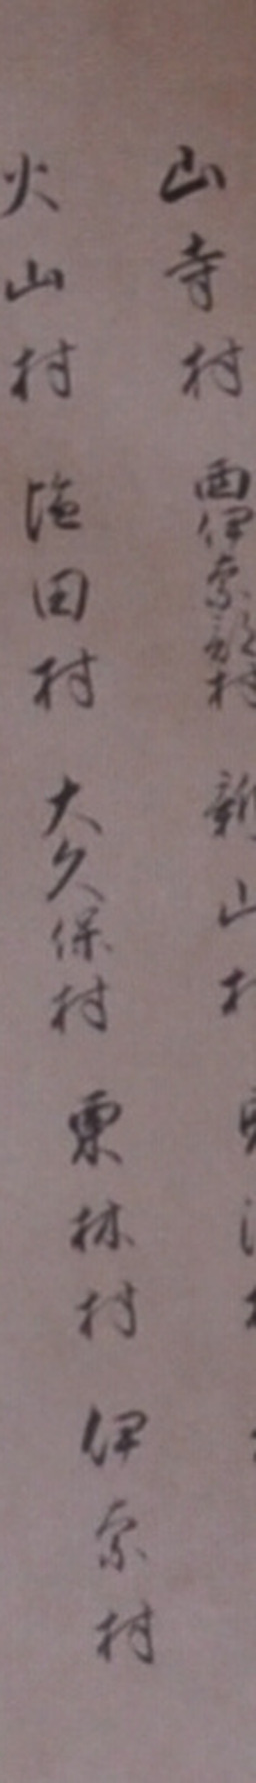火山村塩田村大久保村栗林村伊奈村
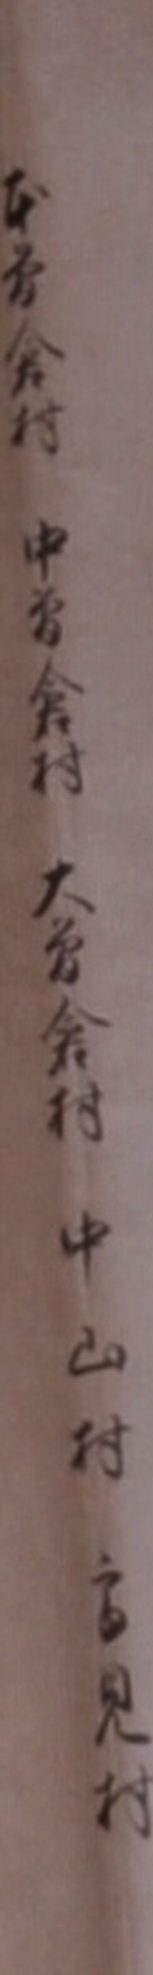本曽倉村中曽倉村大曽倉村中山村高見村
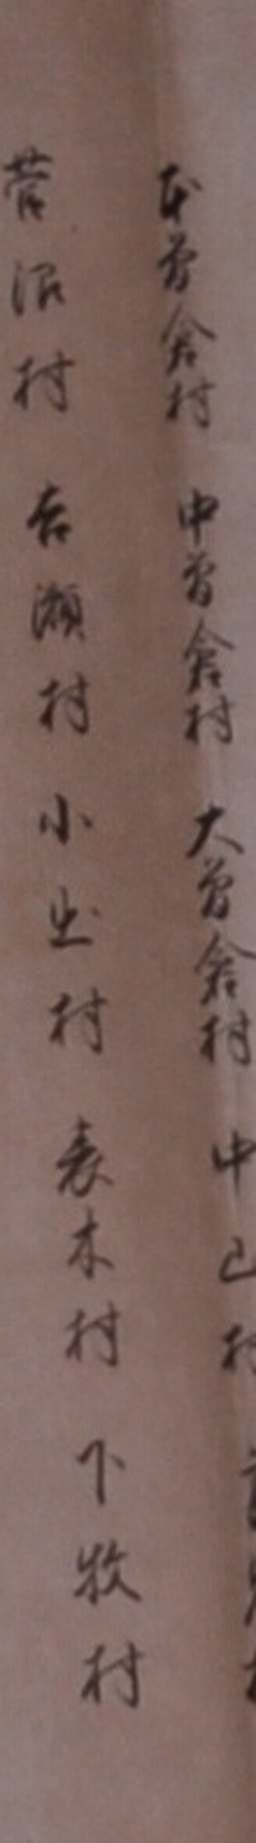菅沼村吉瀬村小出村表木村下牧村
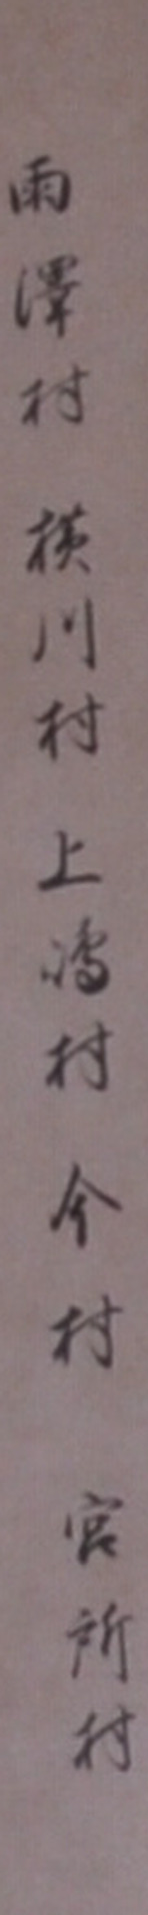雨沢村横川村上島村今村宮所村
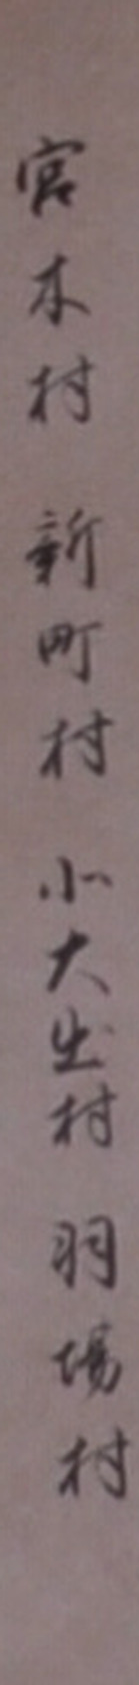宮木村新町村北大出村羽場村
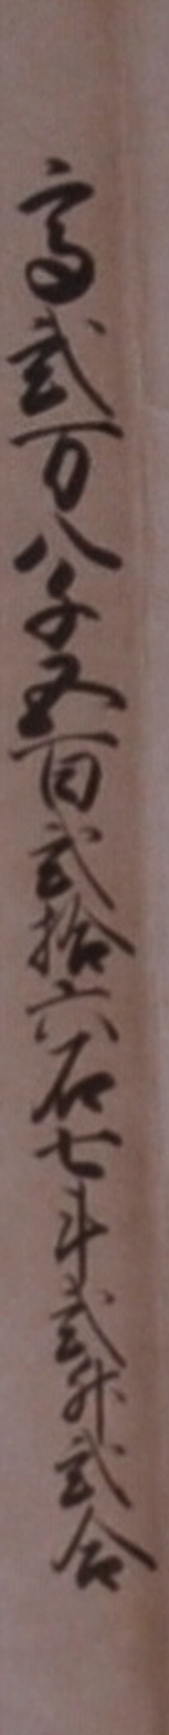高弐万八千五百弐拾六石七斗弐升弐合
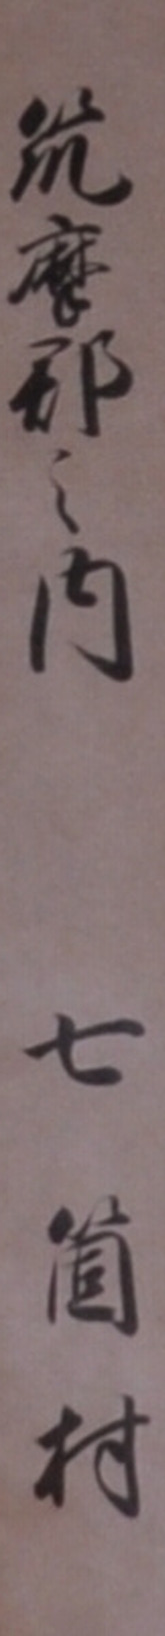筑摩郡之内七箇村
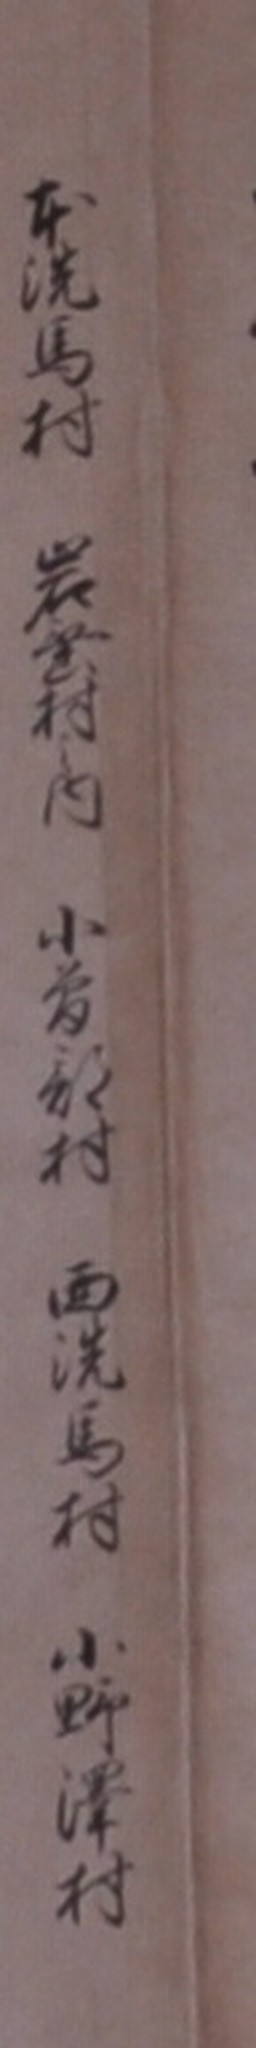本洗馬村岩垂村之内小曽部村西洗馬村小野沢村
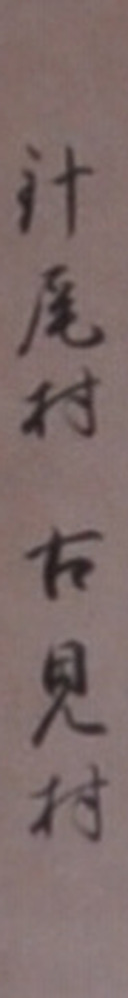針尾村古見村
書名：御朱印写・領地目録
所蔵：伊那市立高遠町図書館・合同会社AMANE
